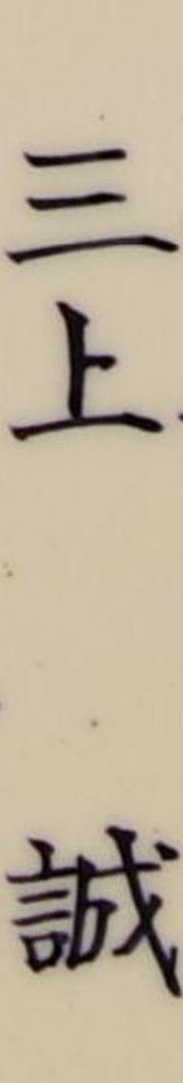三上誠
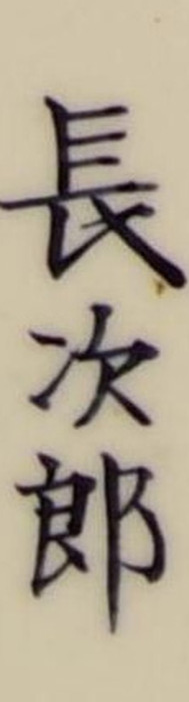長次郎
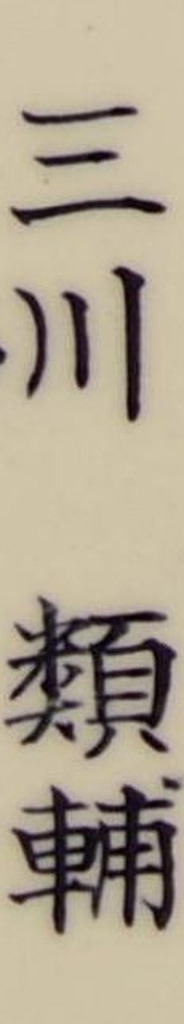三川類輔
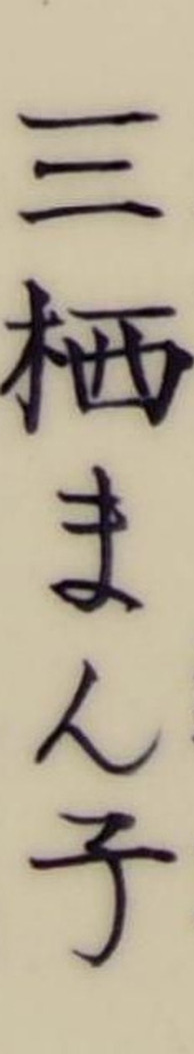三栖まん子
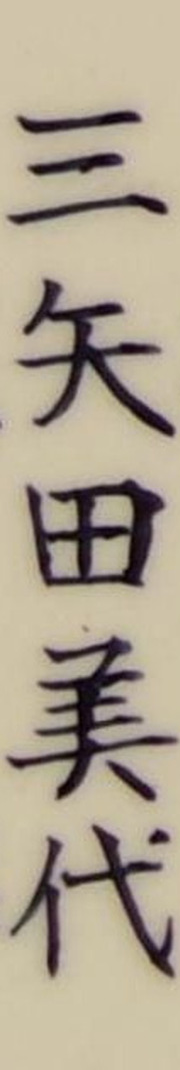三矢田美代
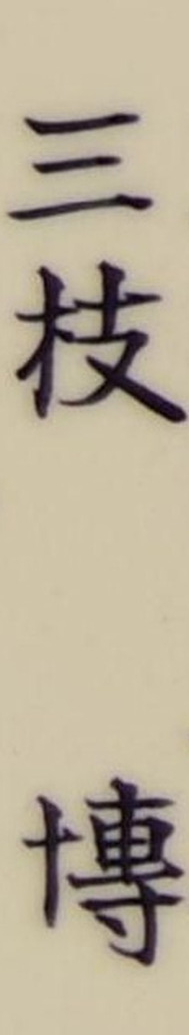三枝博
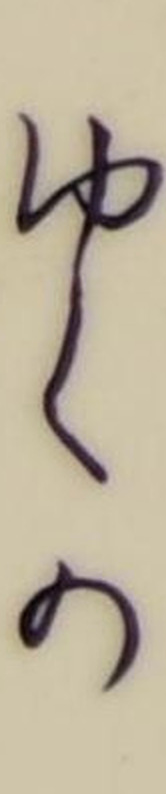ゆくの
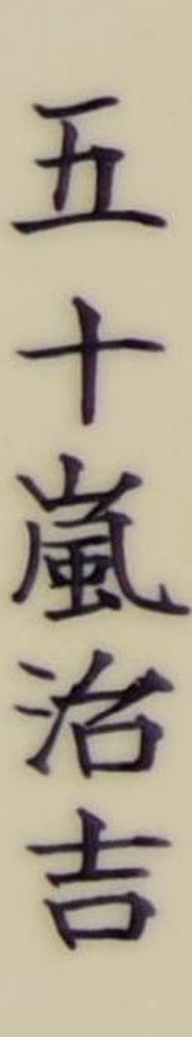五十嵐治吉
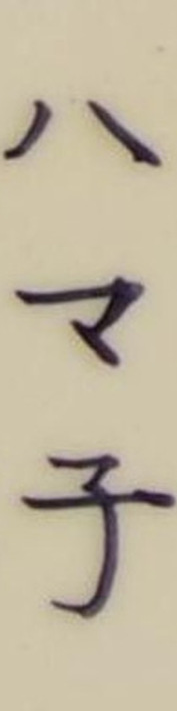ハマ子
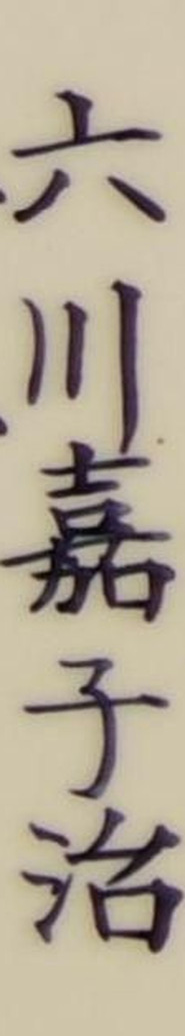六川嘉子治
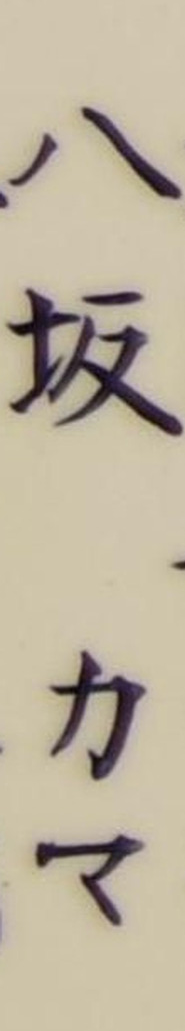八坂カマ
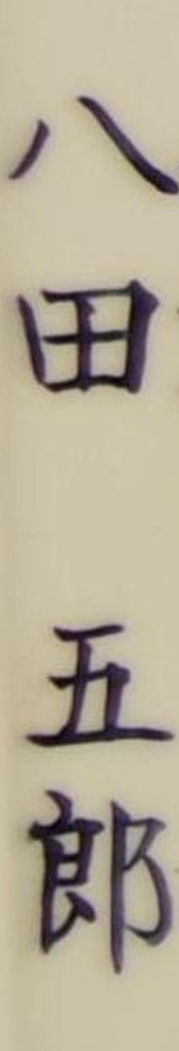八田五郎

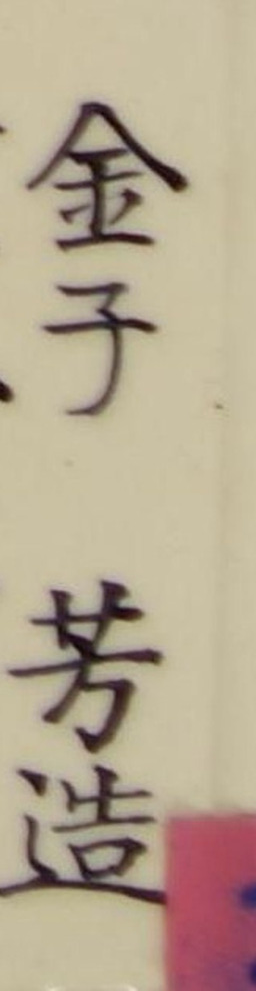金子芳造
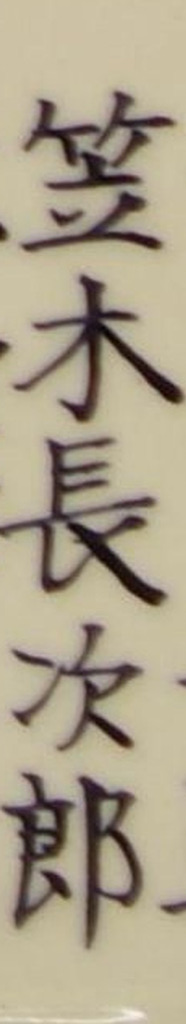笠木長次郎
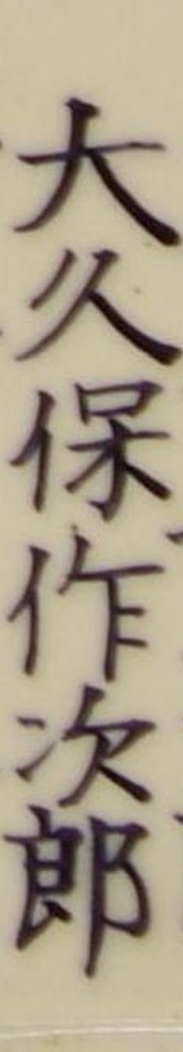大久保作次郎
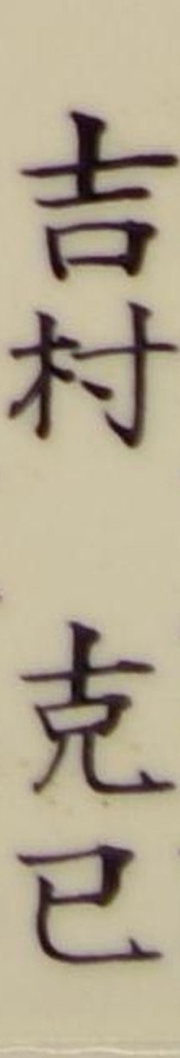吉村克己
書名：E~L
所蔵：高野山金剛峯寺
